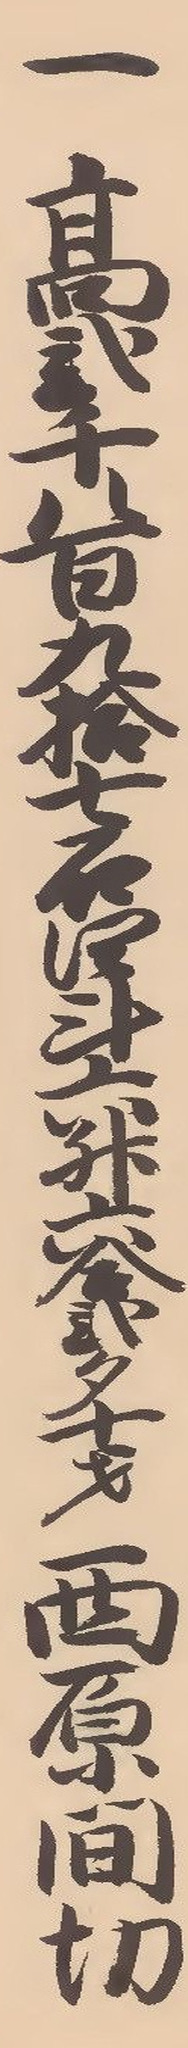一高弐千八百九拾七石四斗六升六合弐勺七才西原間切
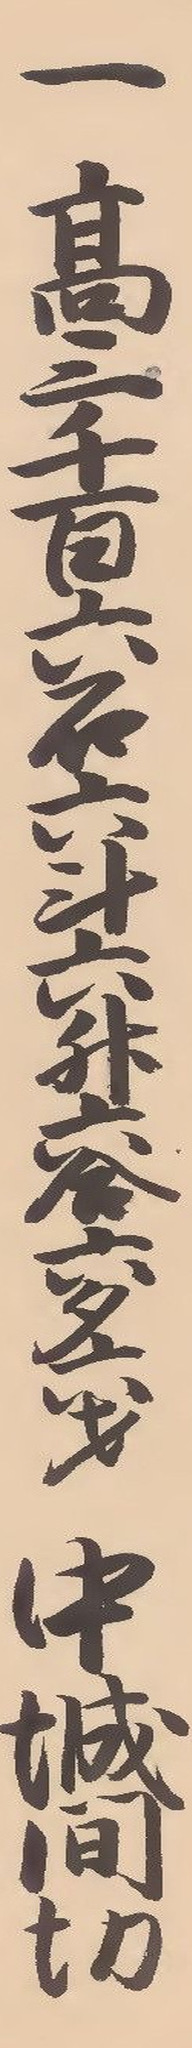一高三千百六石六斗六升六合六勺六才中城間切

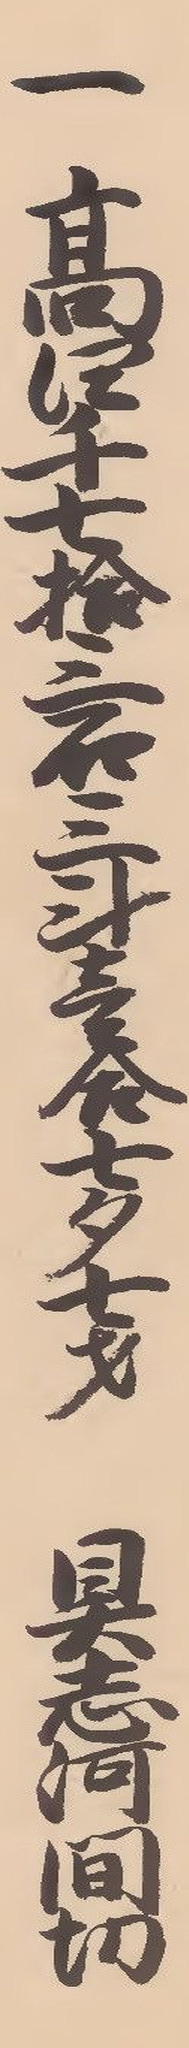一高四千七拾三石三斗壱合七勺七才具志河間切
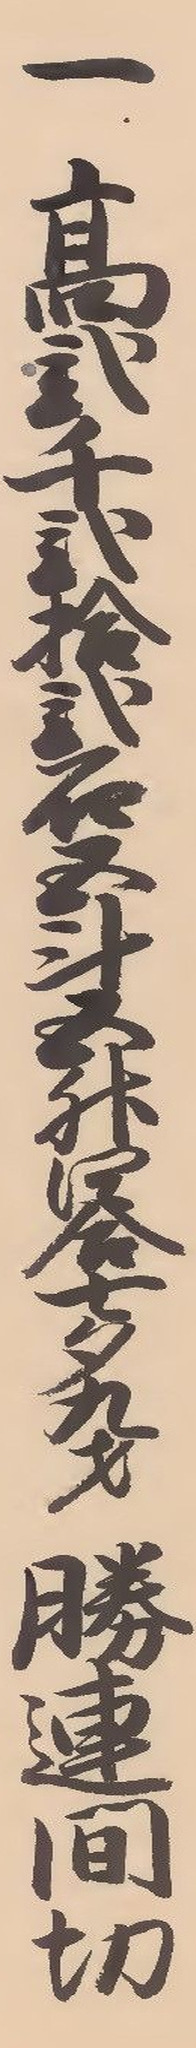一高弐千弐拾弐石五斗五升四合七勺九才勝連間切
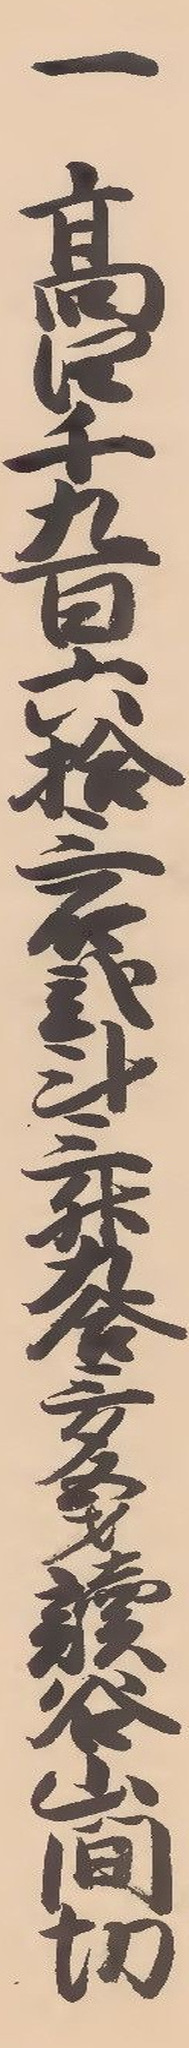一高四千九百六拾三石弐斗三升九合三勺五才読谷山間切
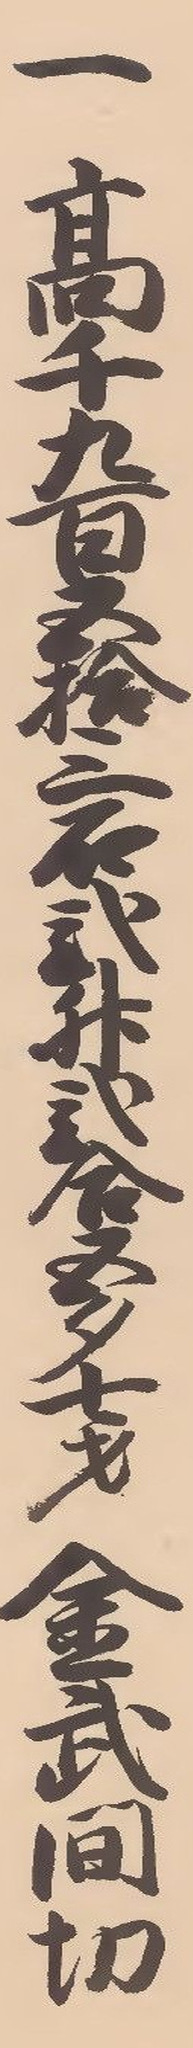一高千九百五拾三石弐升弐合弐合五勺七才金武間切
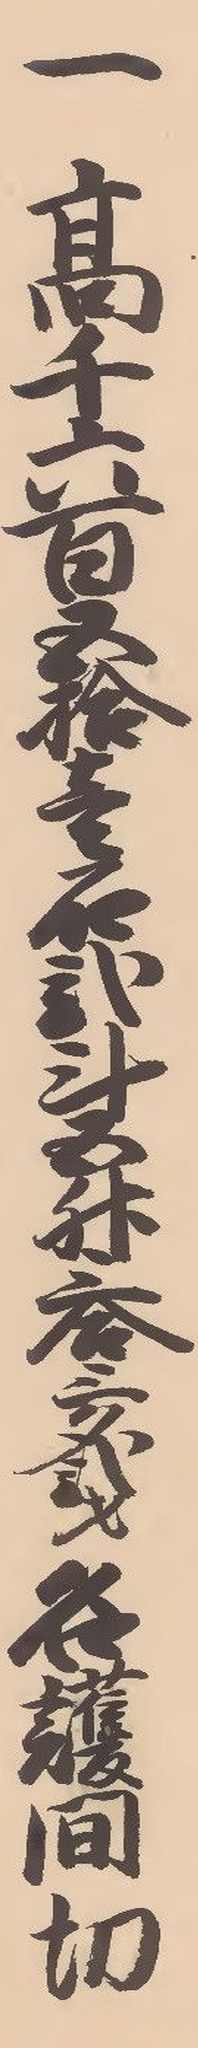一高千六百五拾壱石弐斗五升三合三勺弐才名護間切
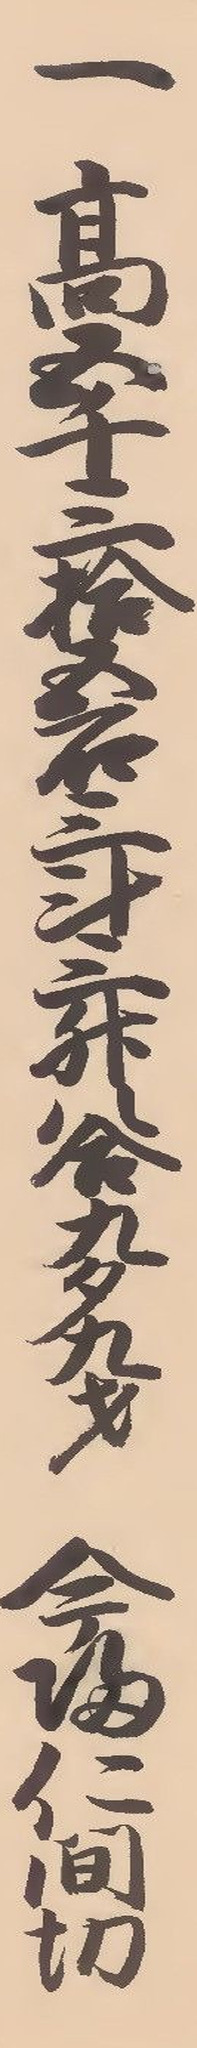一高五千三拾五石三斗三升八合九勺九才今帰仁間切
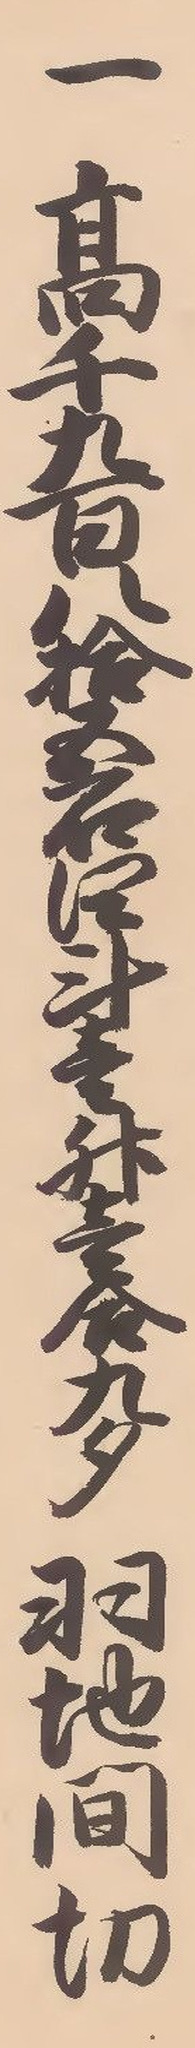一高千九百八拾五石四斗壱升壱合九勺羽地間切

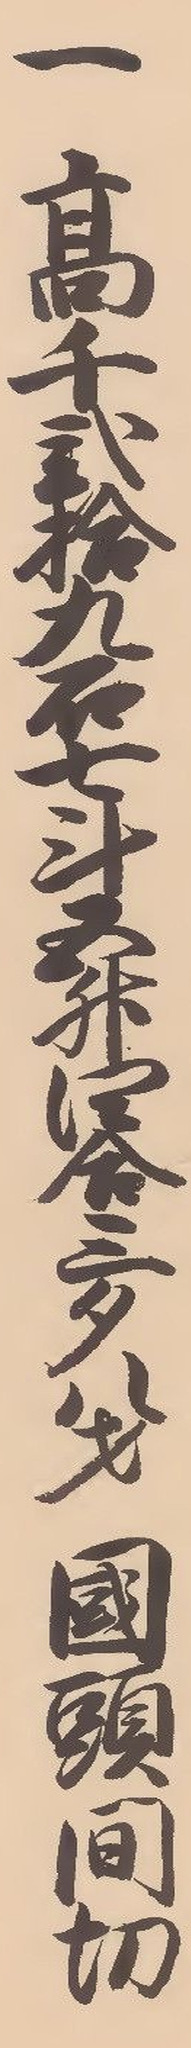一高千弐拾九石七斗五升四合三勺八才国頭間切
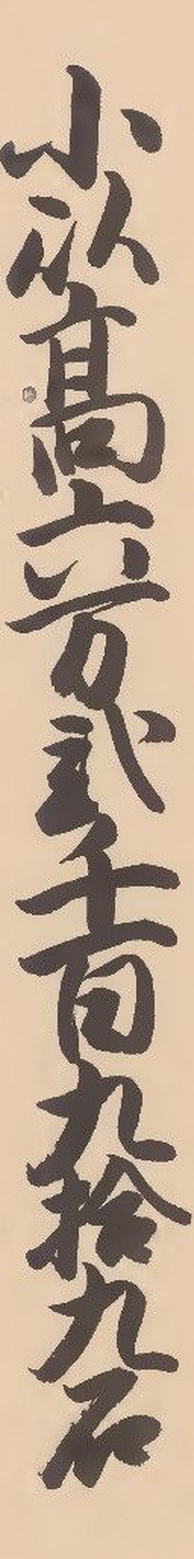小以高六万弐千百九拾九石

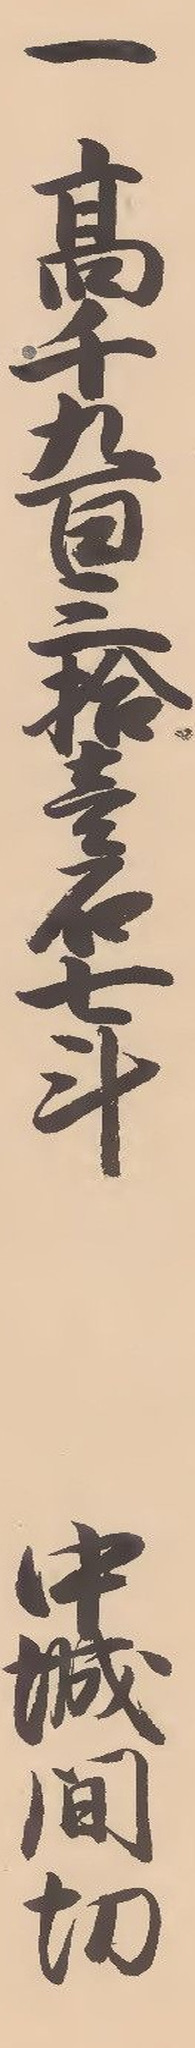一高千九百三拾壱石七斗中城間切
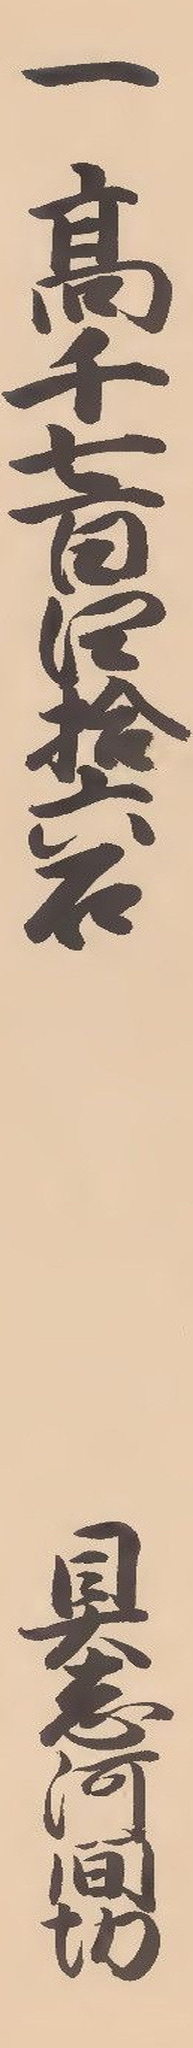一高千七百四拾六石具志河間切
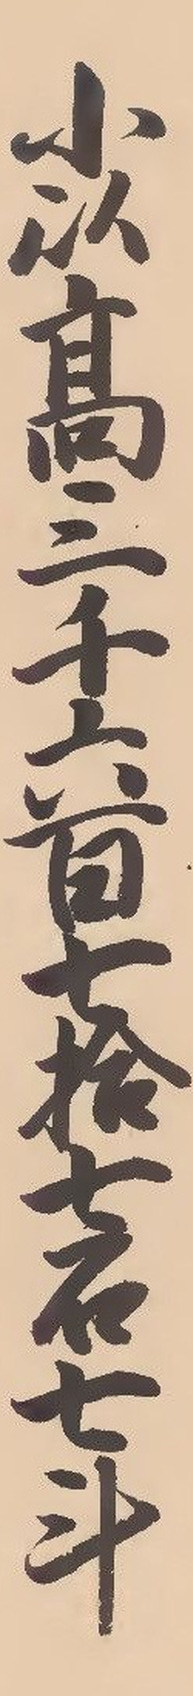小以高三千六百七拾七石七斗
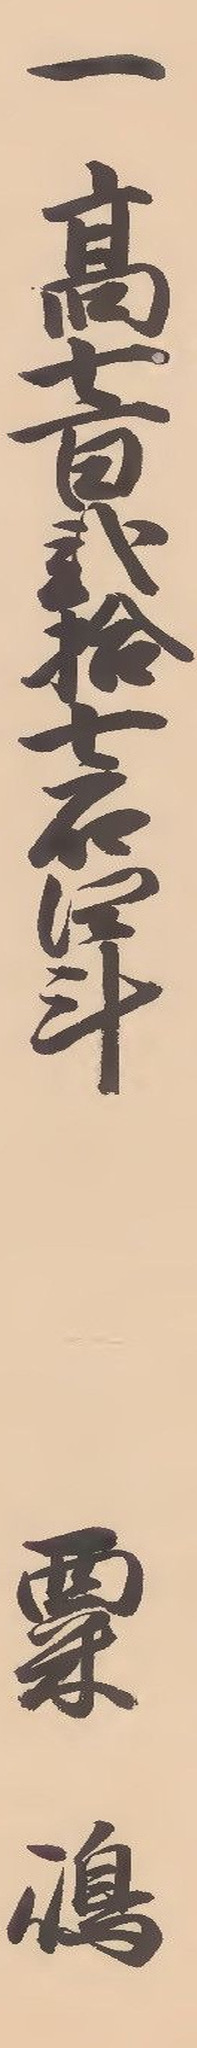一高七百弐拾七石四斗粟嶋

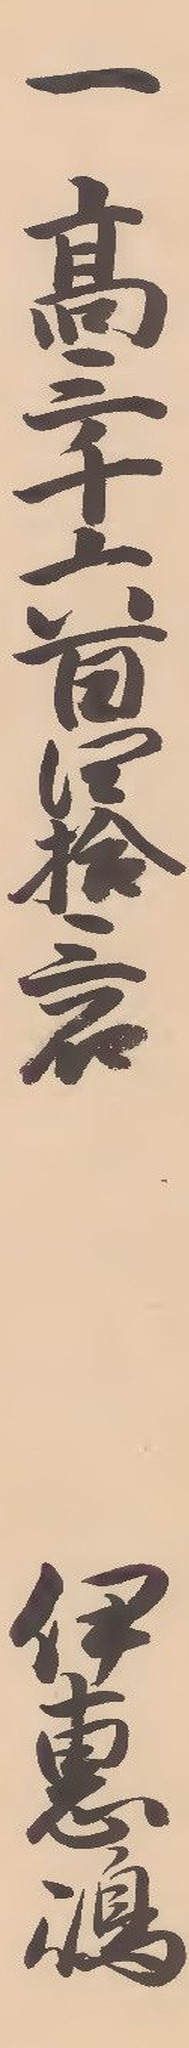一高三千六百四拾三石伊恵嶋
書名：琉球国郷帳　上
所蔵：国立公文書館 National Archives of Japan
